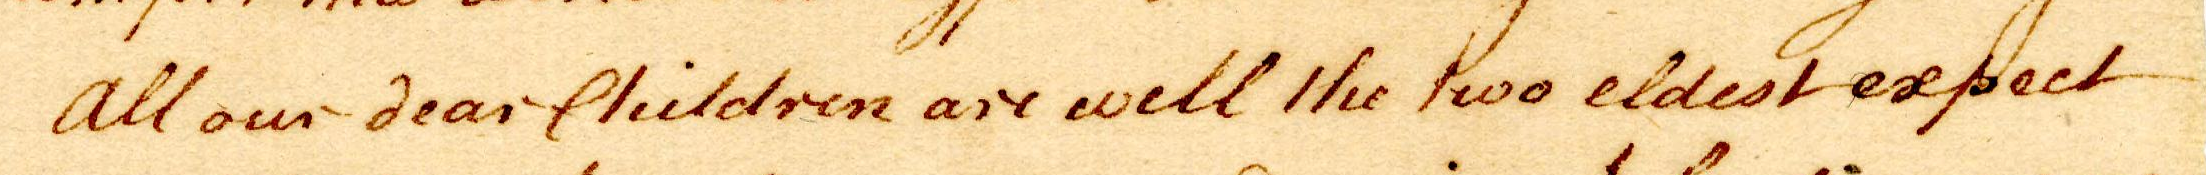All our dear Children are well the two eldest expect
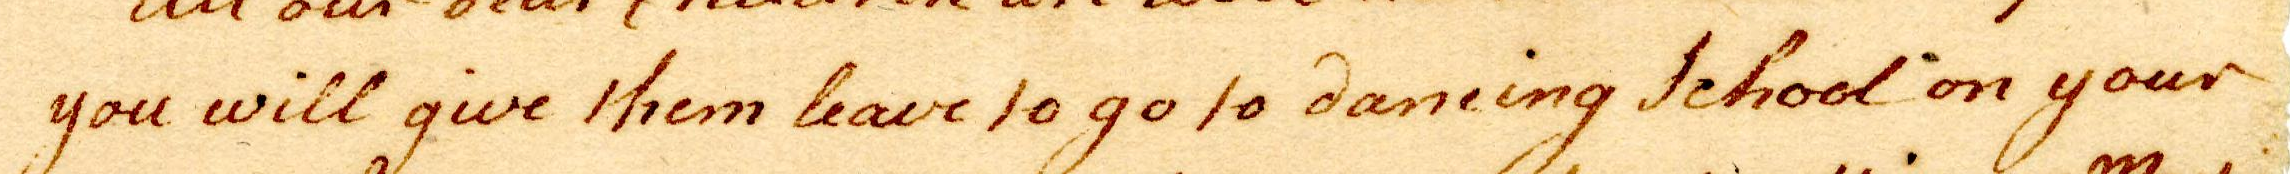you will give them leave to go to dancing School on your
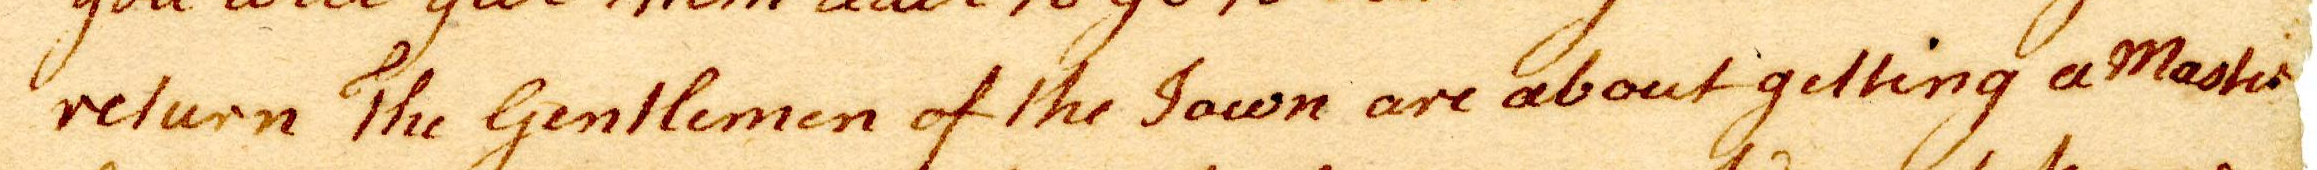return The Gentlemen of the Town are about getting a Master
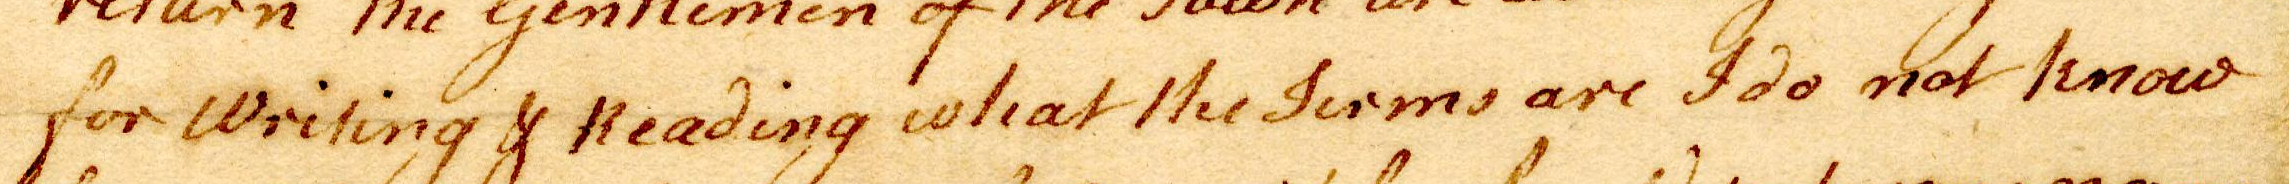for Writing & Reading what the Terms are I do not know
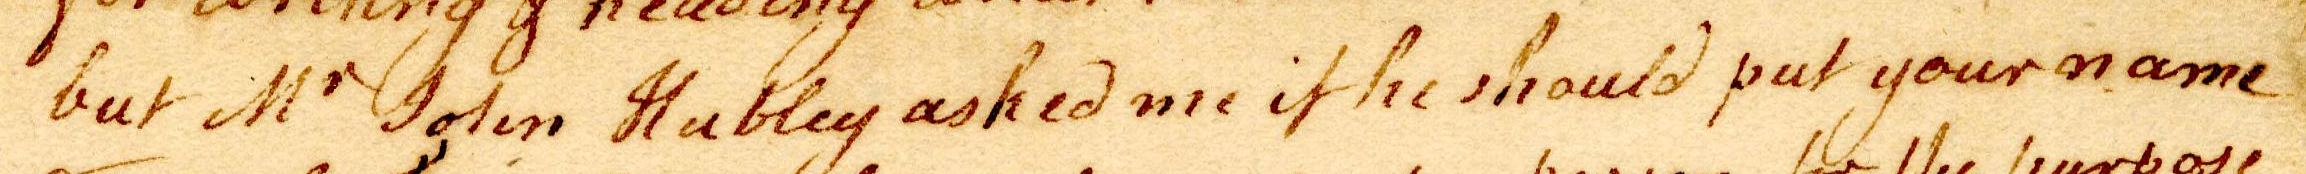but M^r John Hubley asked me if he should put your name
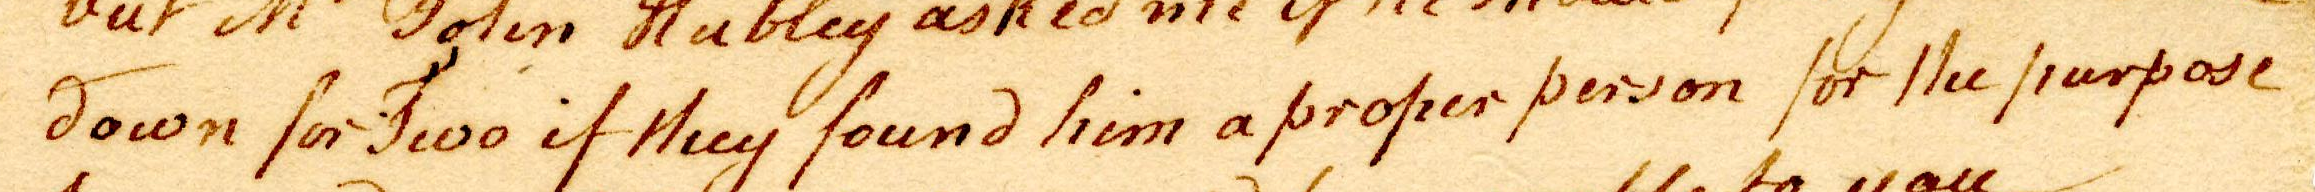down for Two if they found him a proper person for the purpose
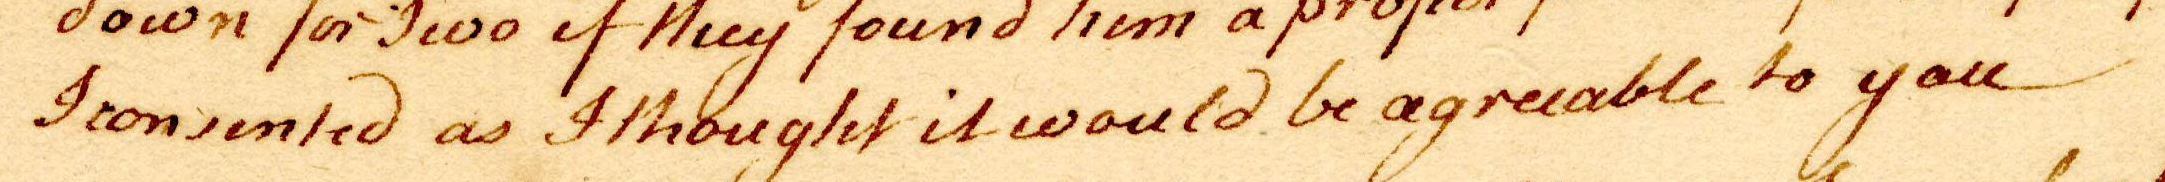I consented as I thought it would be agreeable to you
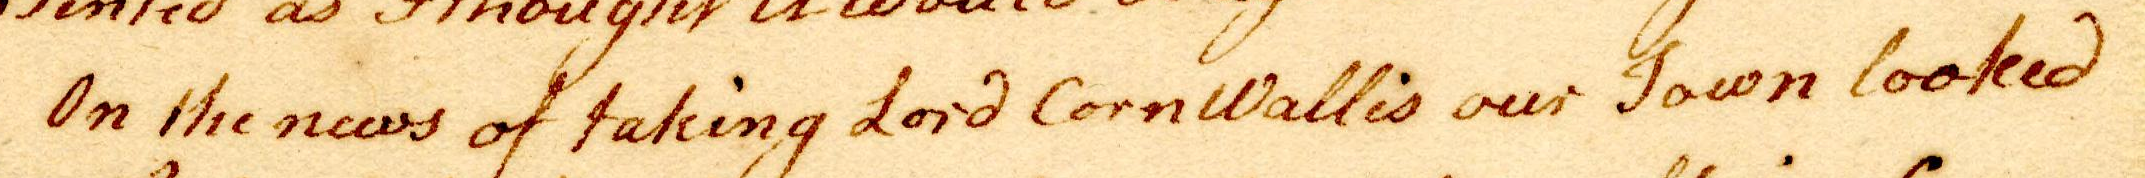On the news of taking Lord Cornwallis our Town looked
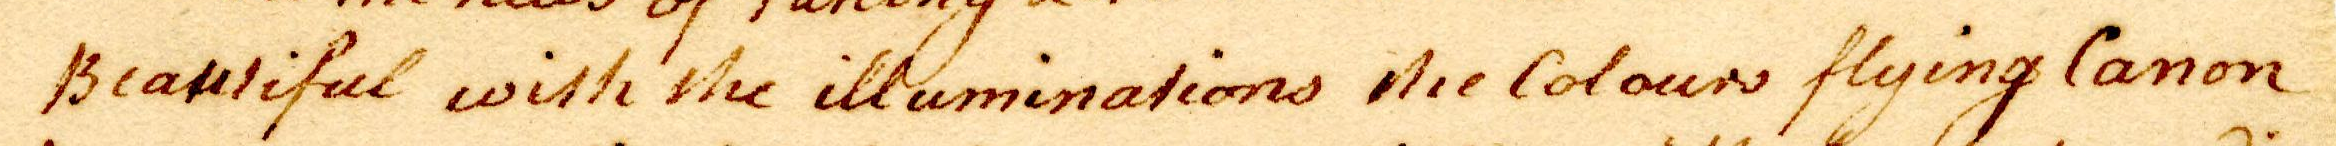Beautiful with the illuminations the Colours flying Canon
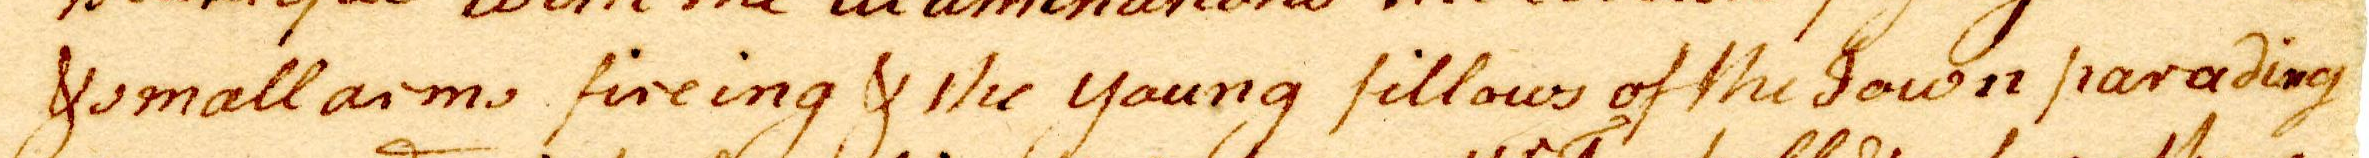& small arms fireing & the young fellows of the Town parading
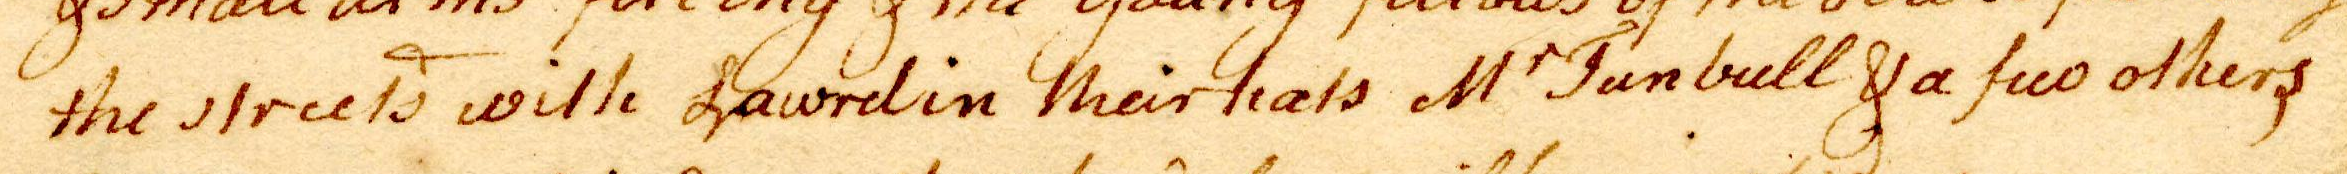the streets with Laurel in their hats M^r Tunbull & a two others
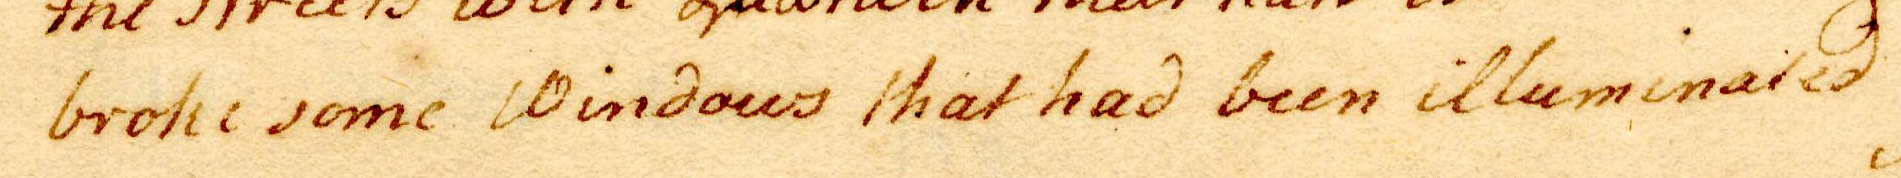broke some windows that had been illuminated
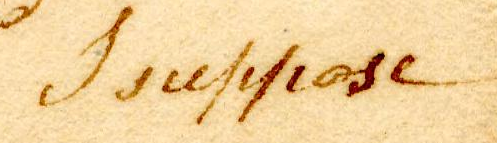I suppose
